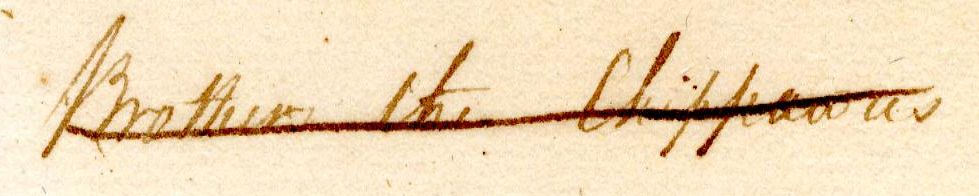Brother the Chippawas
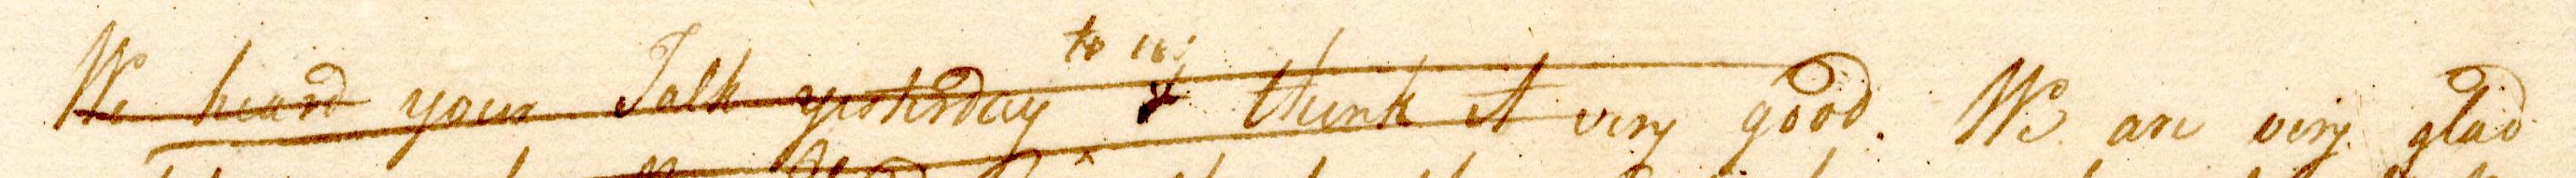We heard your Talk yesterday ^ & think it very good. We are very glad
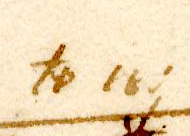to us
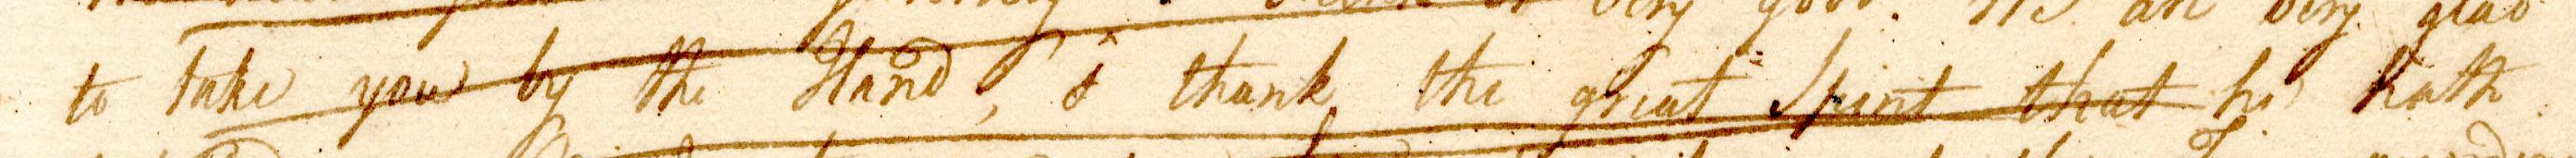to take you by the Hand, & thank the great Spirit that he hath
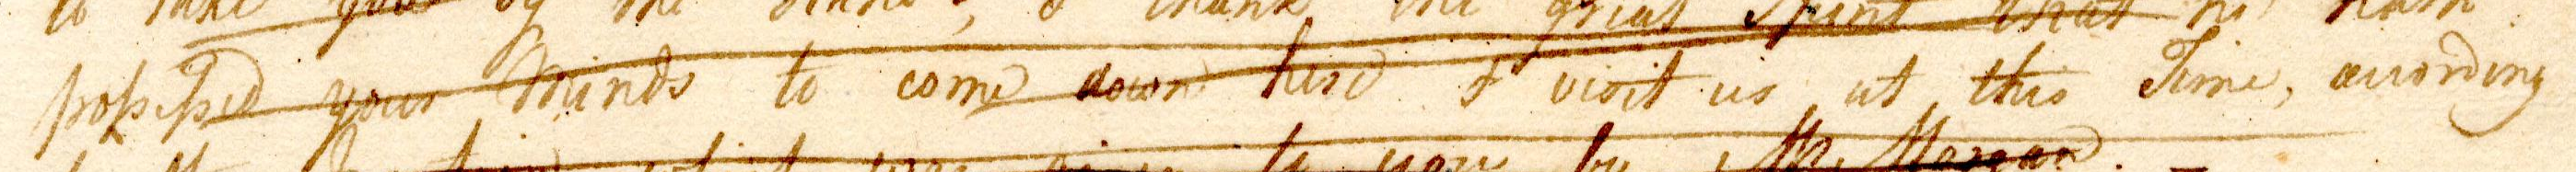possessed your minds to come down here & visit us at this Time, according
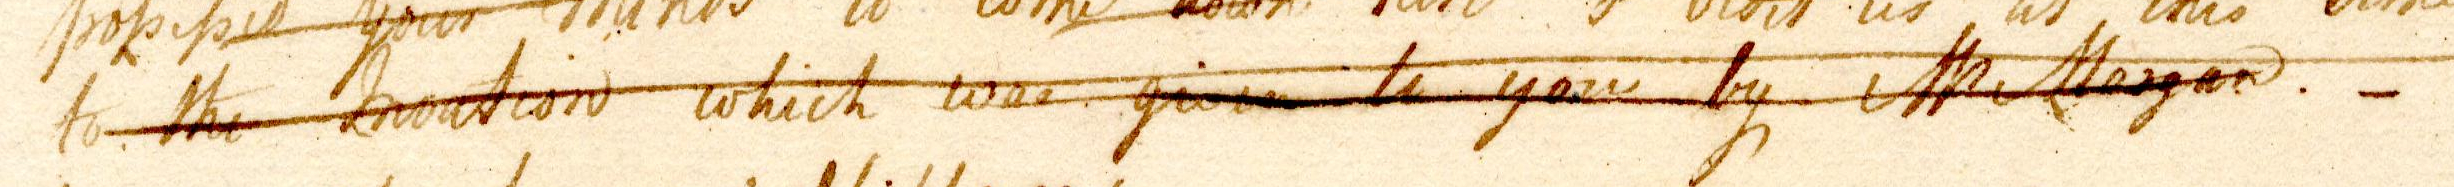to the Question which was [given to you by M^r Mayor].-
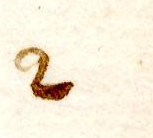2
